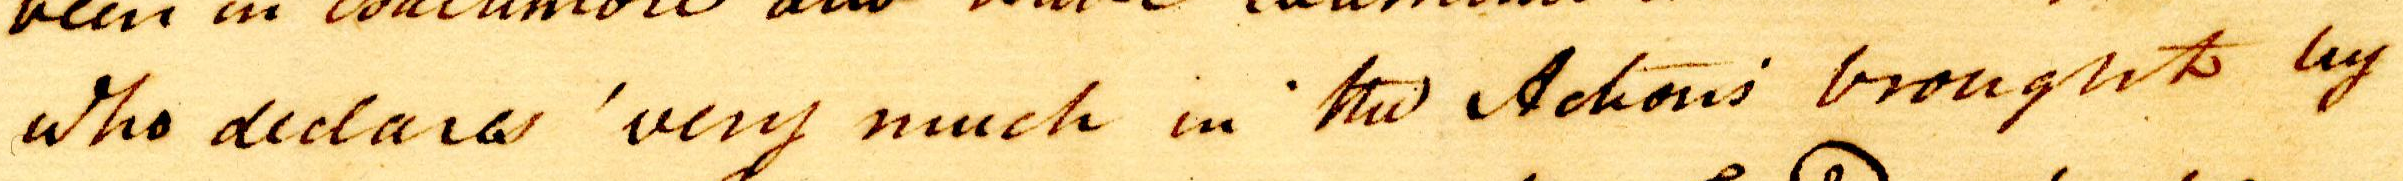who declares very much in the Actions brought by
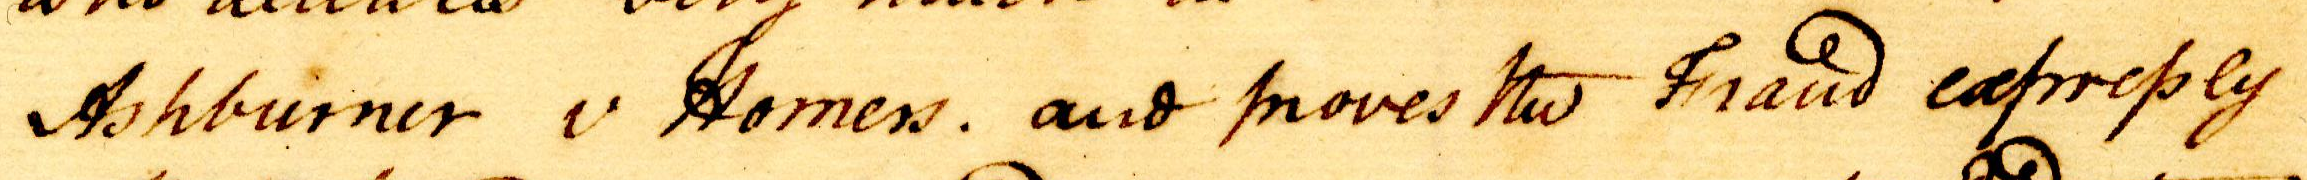Ashburner v Homes. and proves the Fraud expressly
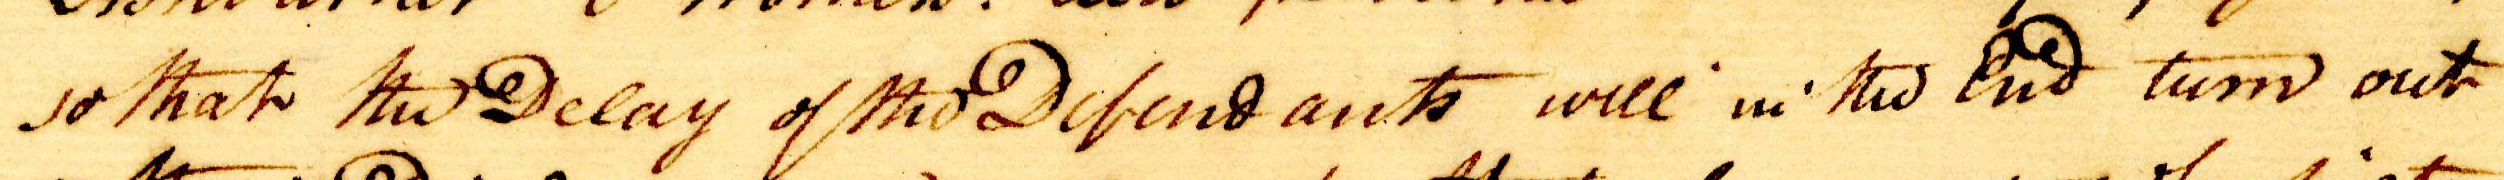so that the Delay of the Defendants will in the End turn out
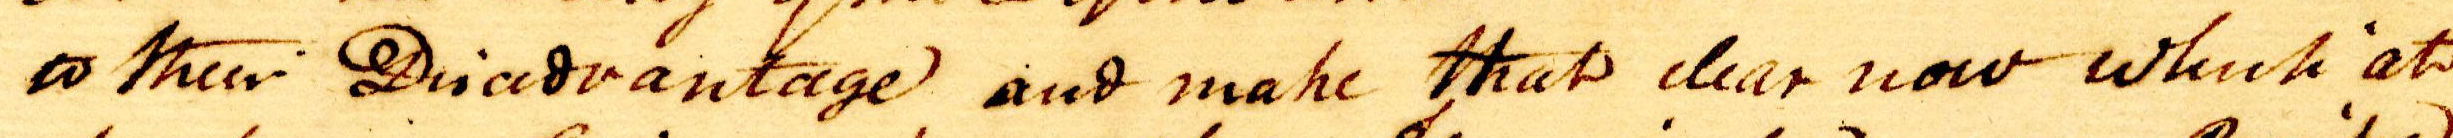to their Disadvantage and make that dear now which at
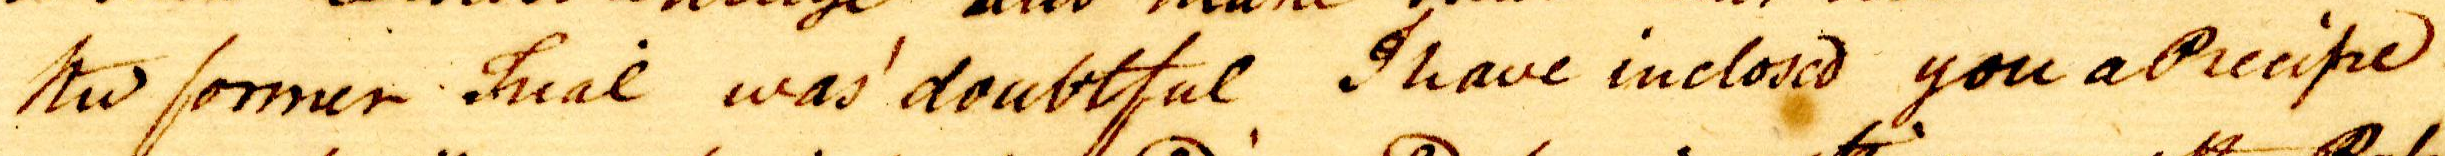the former Trial was doubtful. I have inclosed you a Precipe
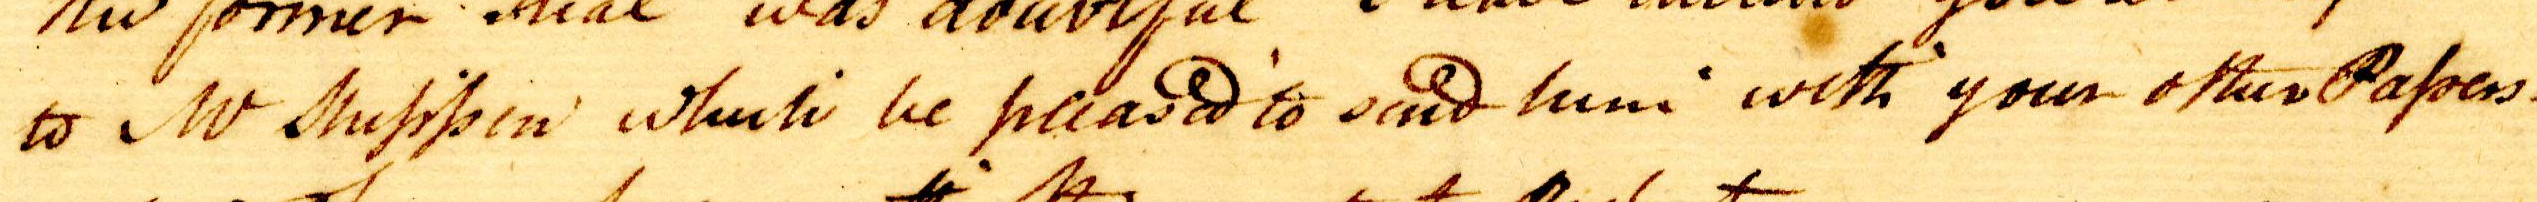to M^r Shippen which be pleasd to send him with your other Papers.
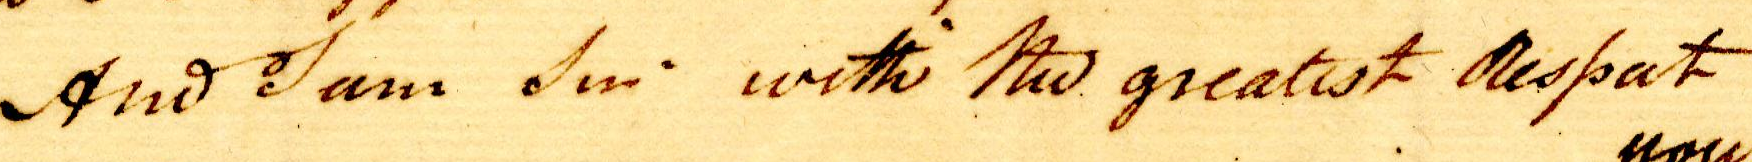And I am Sir with the greatest Respect
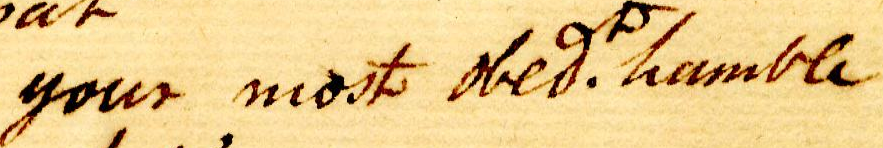your most obed^t. humble
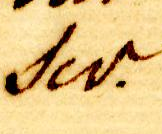Serv.
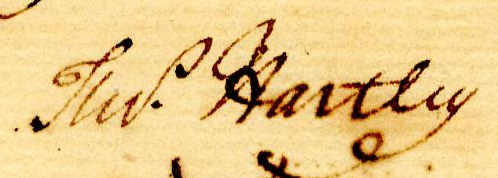Tho^s. Hartley
